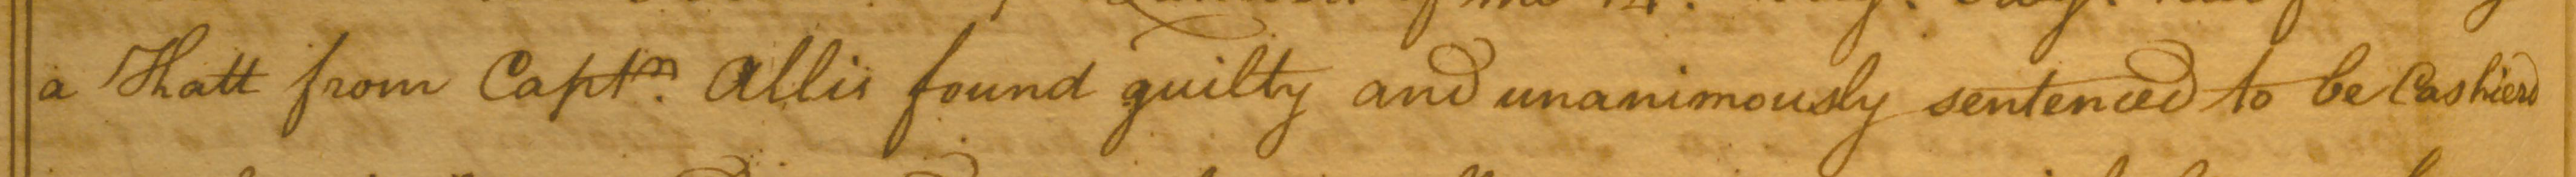a Hatt from Capt^n. Allis found guilty and unanimously sentenced to be Cashierd
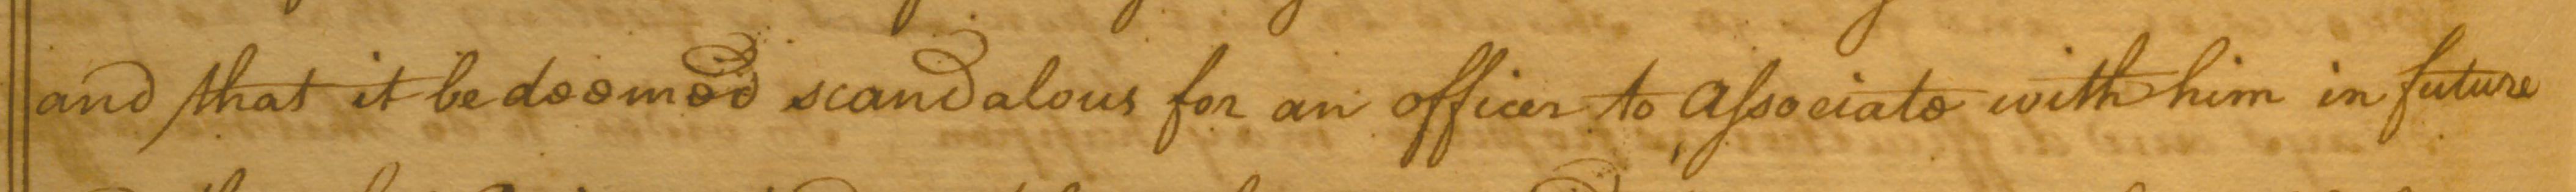and that it be deemed scandalous for an officer to Associate with him in future
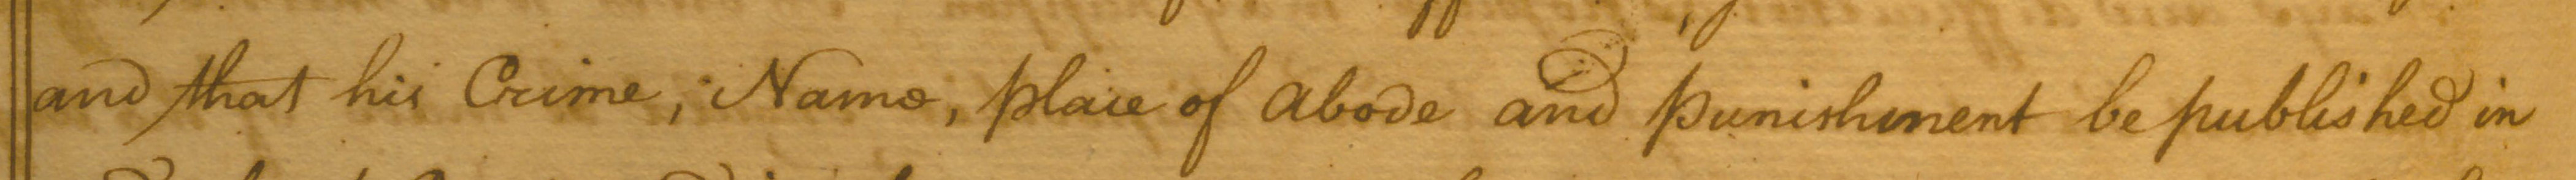and that his Crime, Name, place of abode and punishment be published in
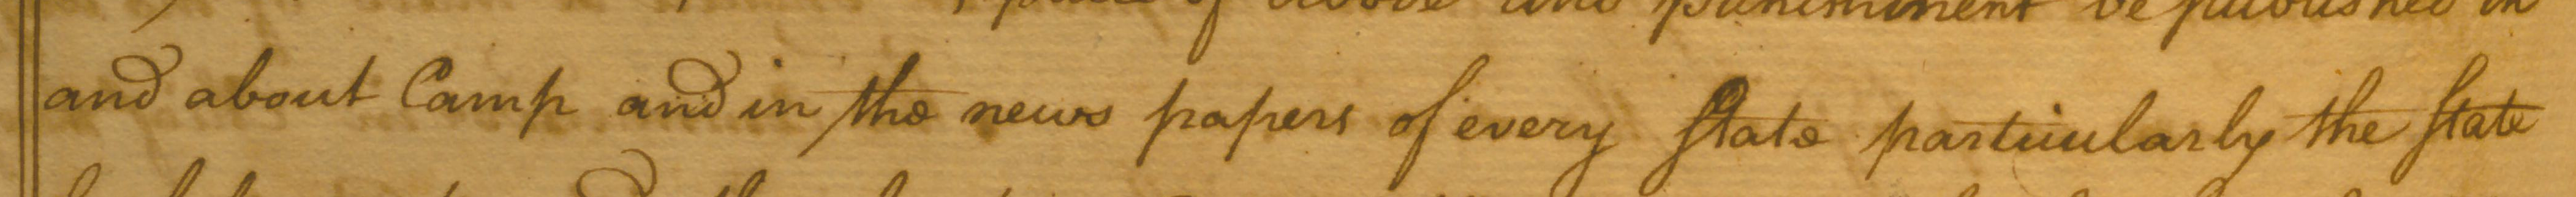and about Camp and in the news papers of every state particularly the state
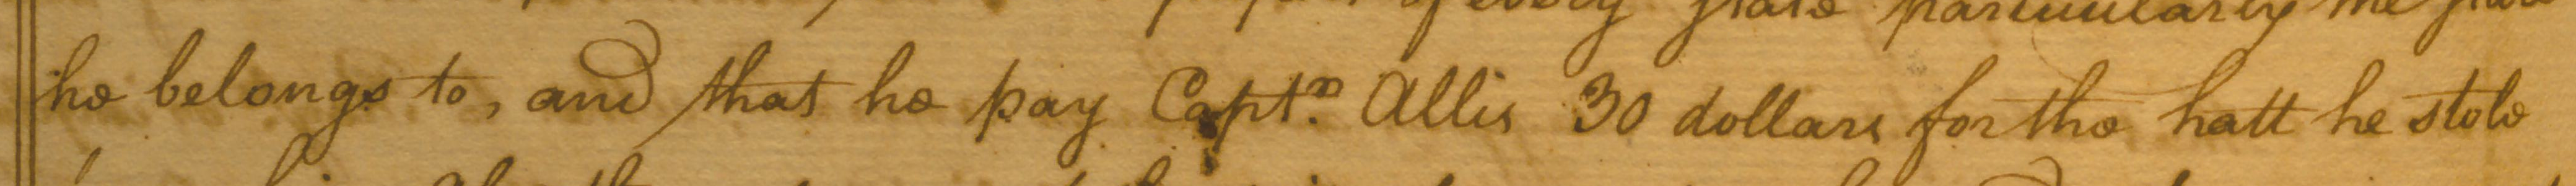he belongs to, and that he pay Capt^n. Allis 30 dollars for the hatt he stole
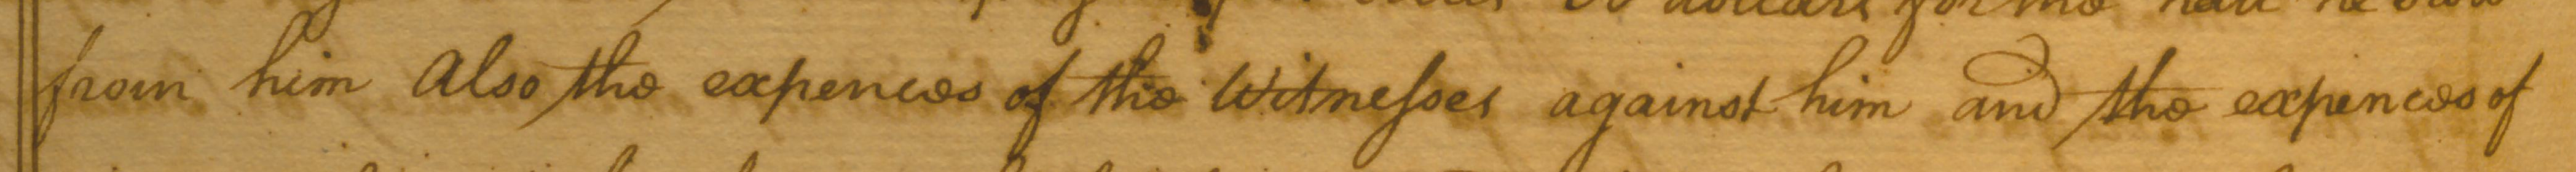from him Also the expences of the Witnesses against him and the expences of
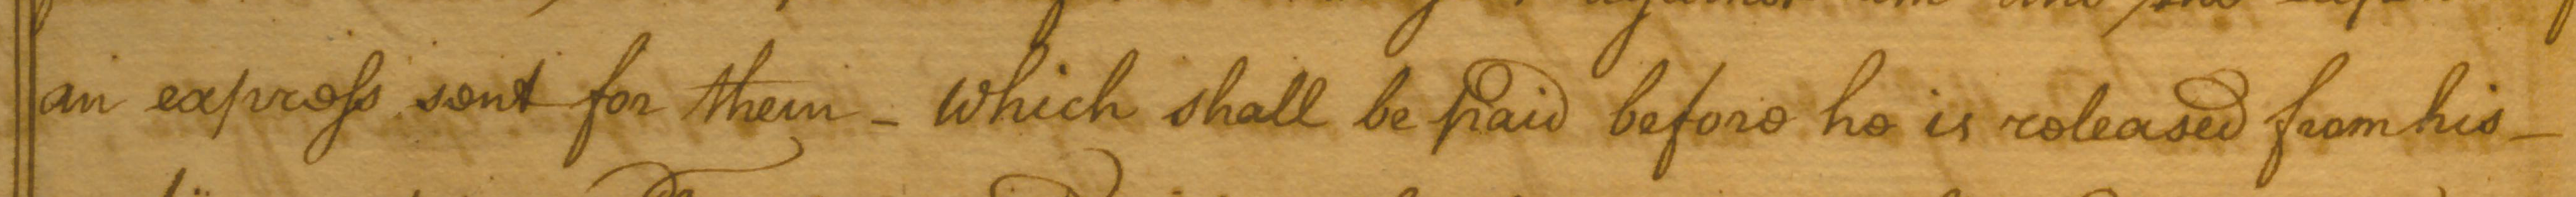an express sent for them- Which shall be paid before he is released from his
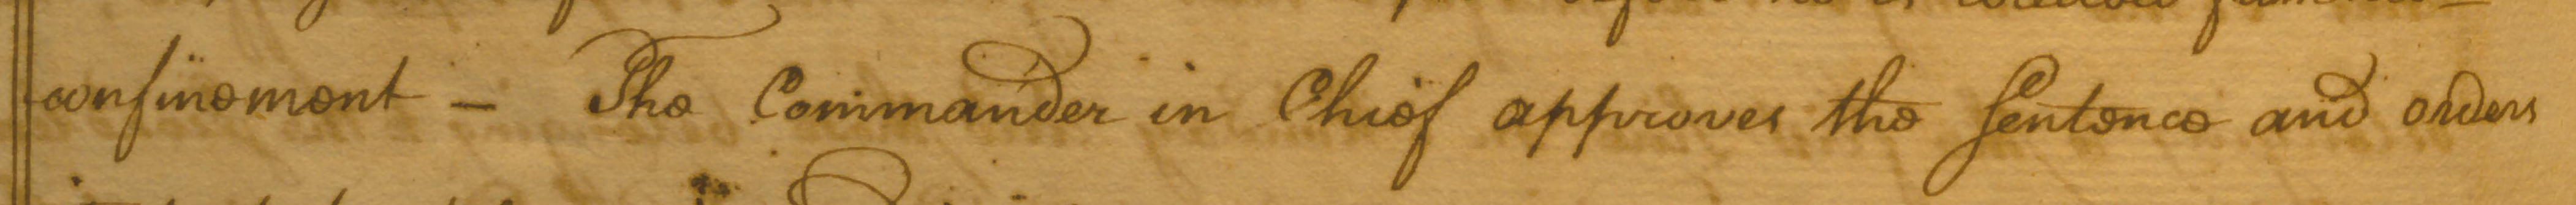confinement- The Commander in Chief approves the sentences and orders
